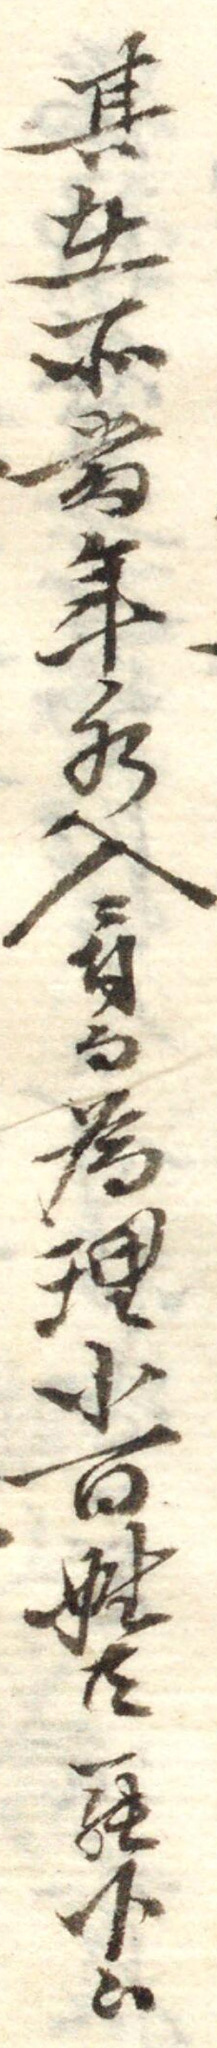其在所当年水入に付而為理小百姓共罷下候
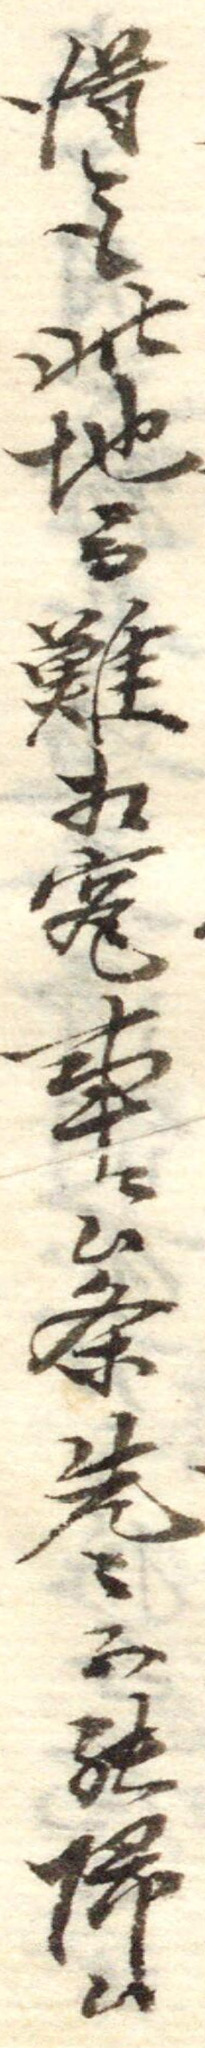得とも此地に而難相究事に候条先々可罷帰候

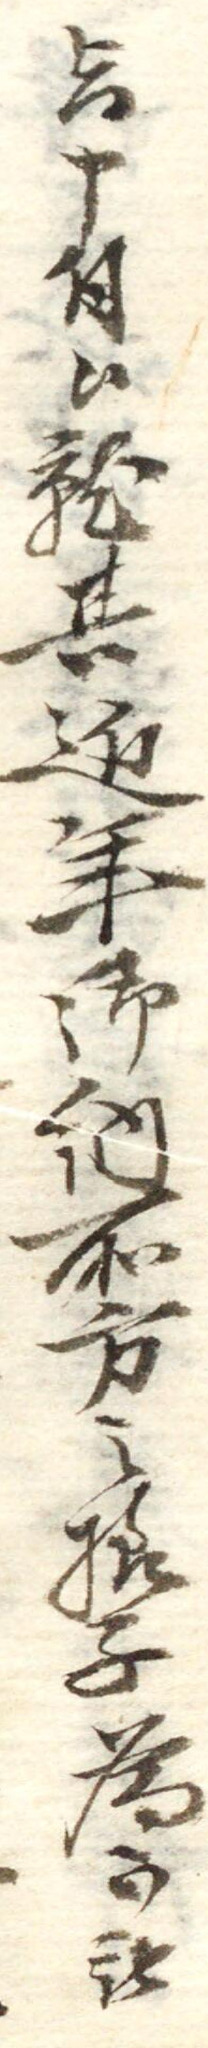旨申付候就其近年御納所方之様子為可被
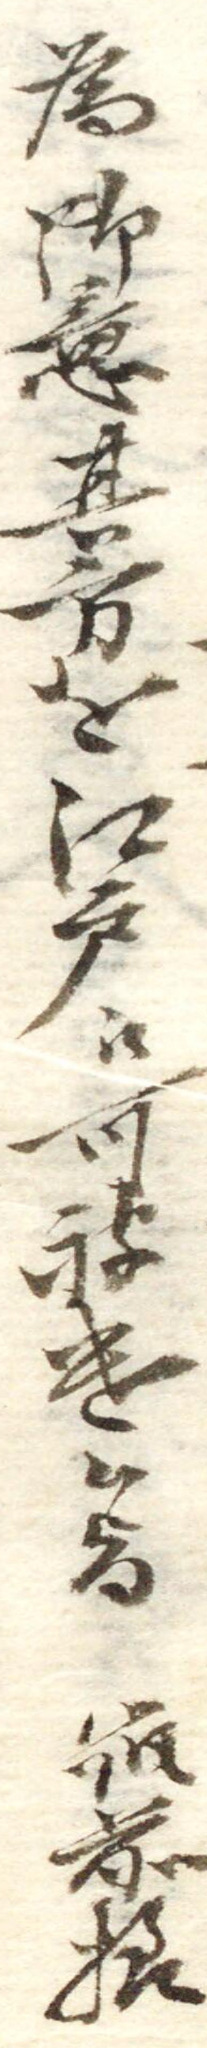為御意其方を江戸江可被遣候旨筑前様
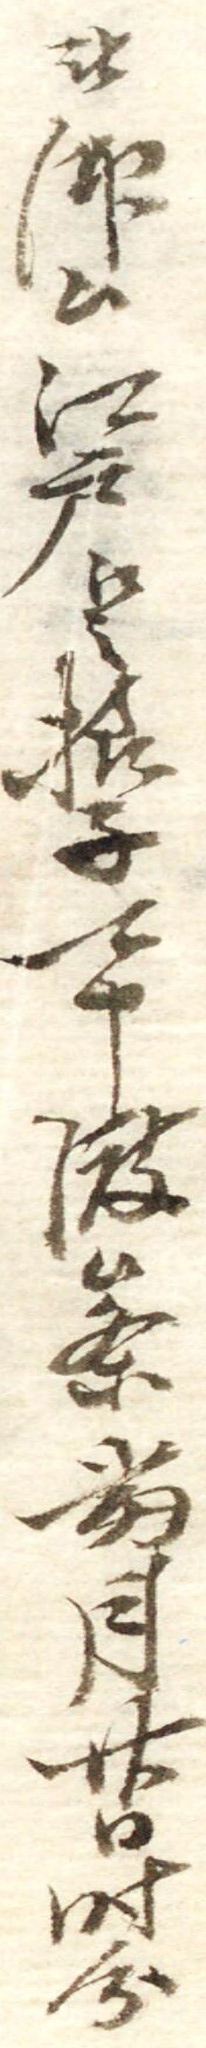被仰候江戸之様子可申渡候条当月廿日時分
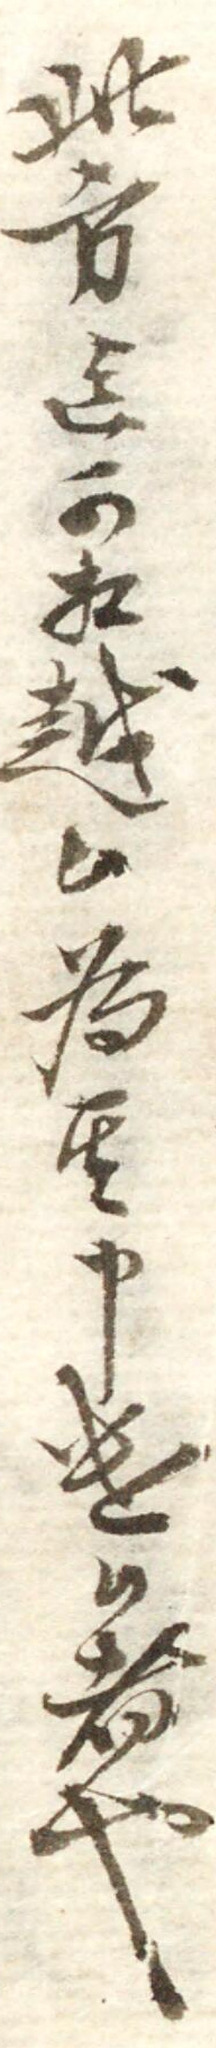此方迄可相越候為其申遣候者也
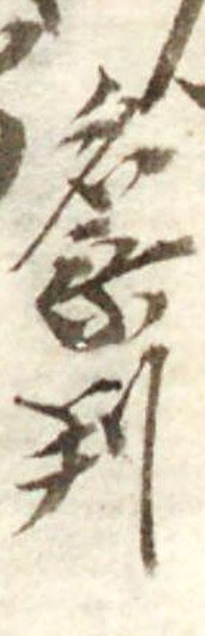名乗判
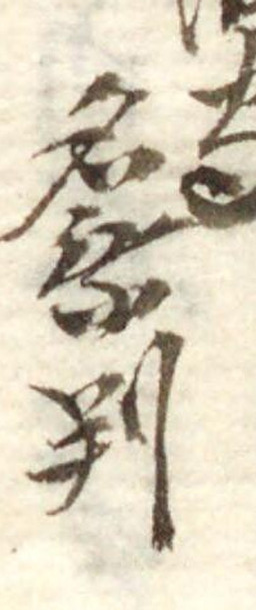名乗判
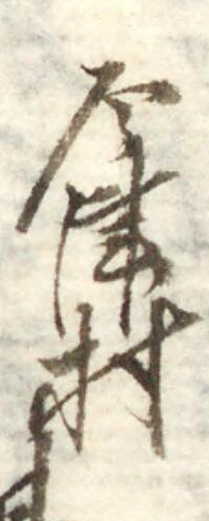今津村
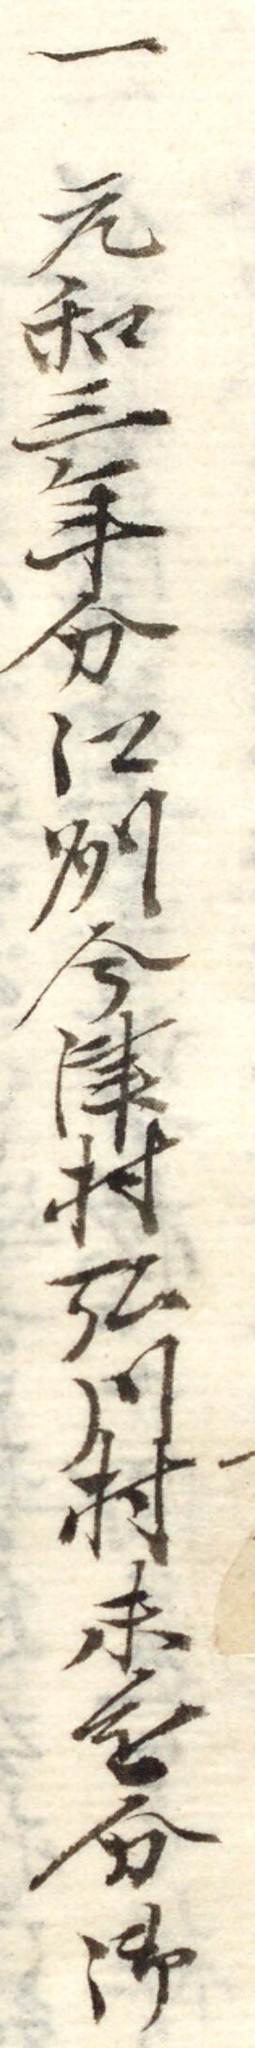一元和三年分江州今津村弘川村未進分御
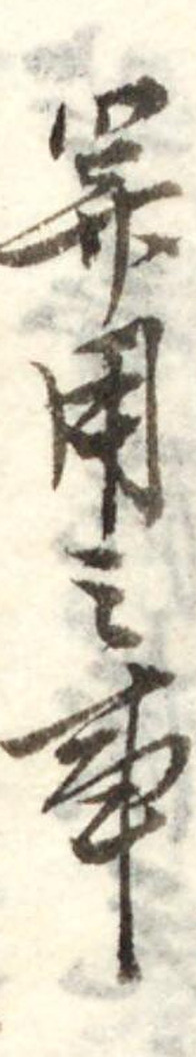算用之事
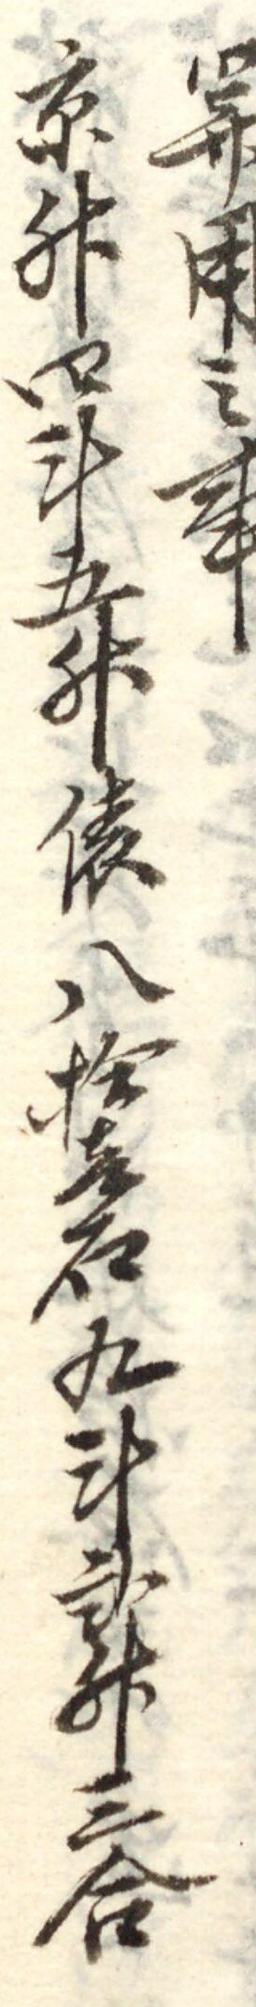京升四斗五升俵八拾壹石九斗貳升三合
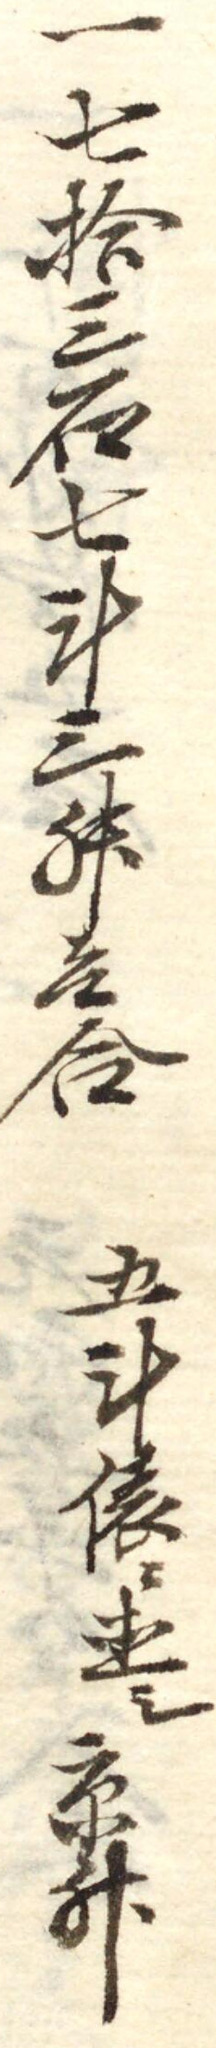一七拾三石七斗三升壹合五斗俵に直し京升
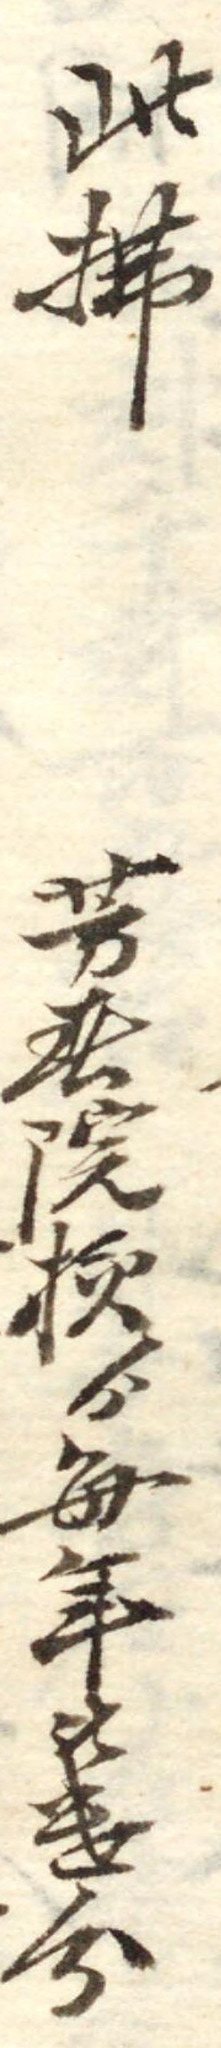此払芳春院様ゟ毎年被遣分
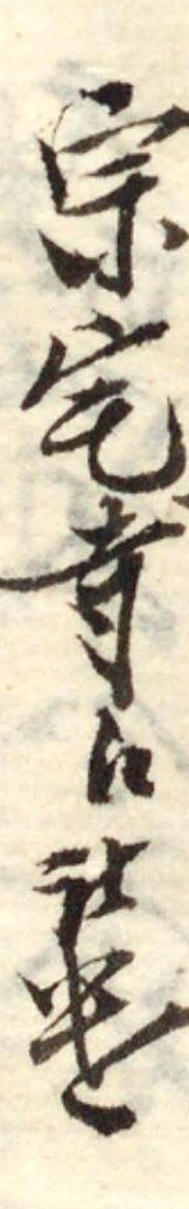宗宅寺江被遣
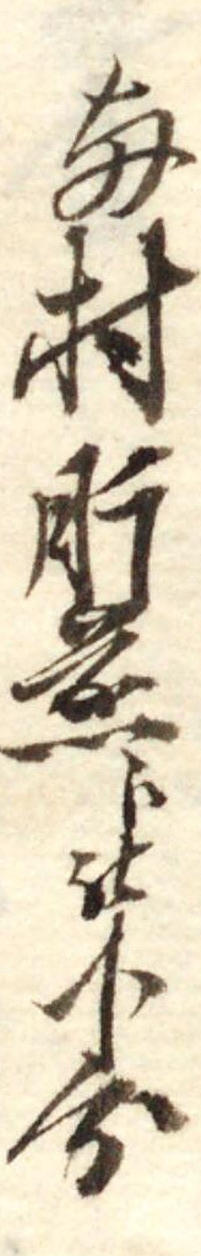両村肝煎分被下分
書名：前田家封国証書集録
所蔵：Ishikawa Prefectural Library
